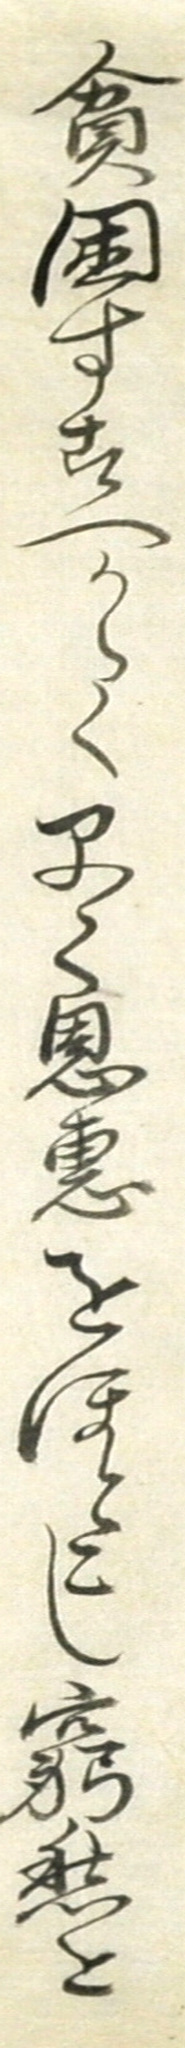貧困すすへからく早く恩恵をほとこし窮愁を
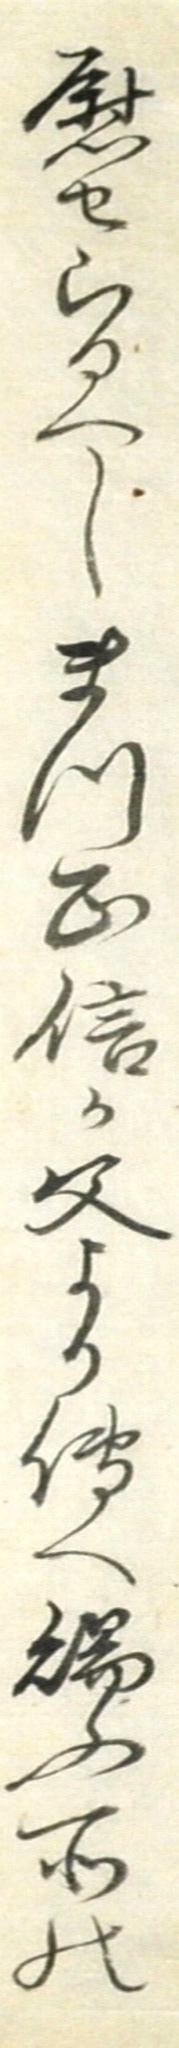慰せらるへしまつ正信か父より伝へ賜ふ所の
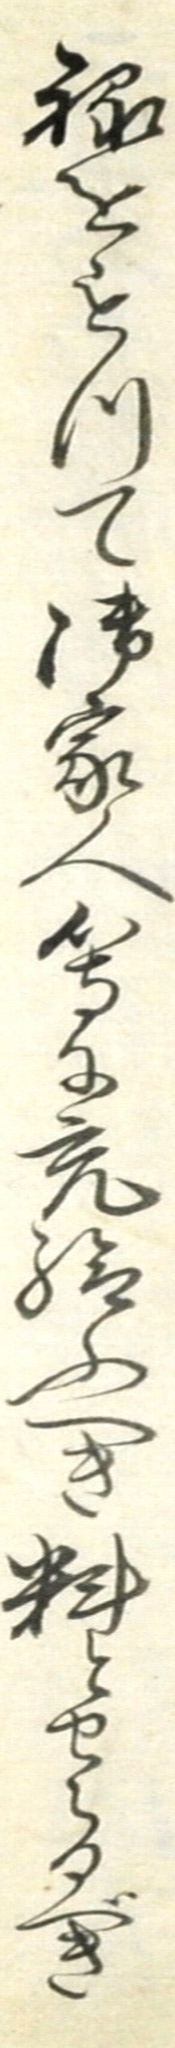禄をもつて御家人等に充給ふへき料とせらるべき
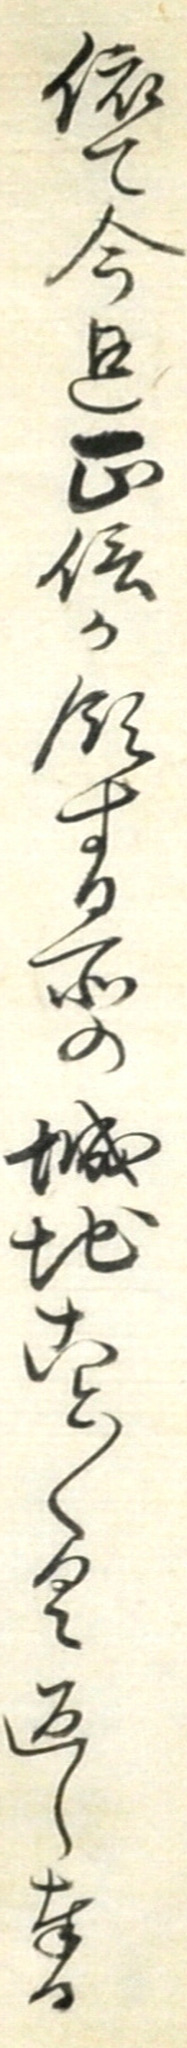依て今迄正信か領する所の城地こと〳〵く返し奉る
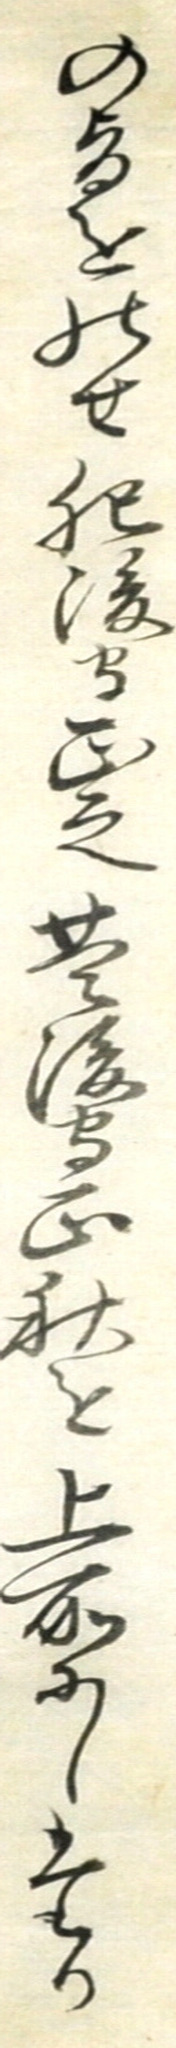の旨をのせ肥後守正之豊後守正秋を上所にし奉り

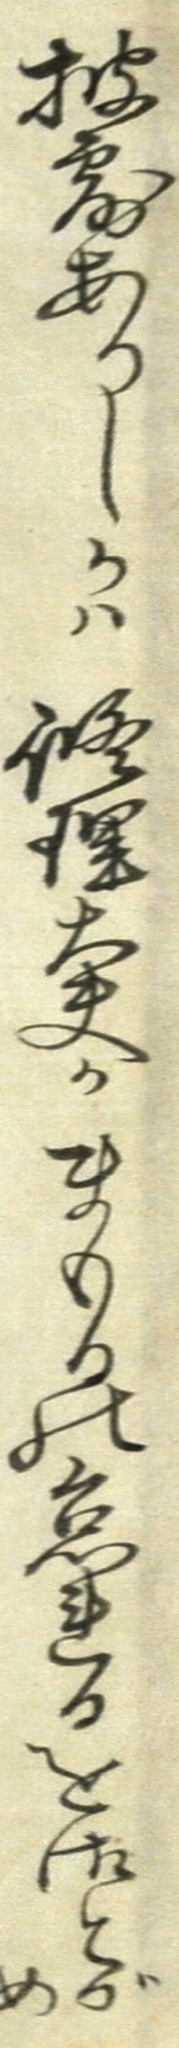披露ありしかは修理大夫かまもるの怠れるを御とがめ
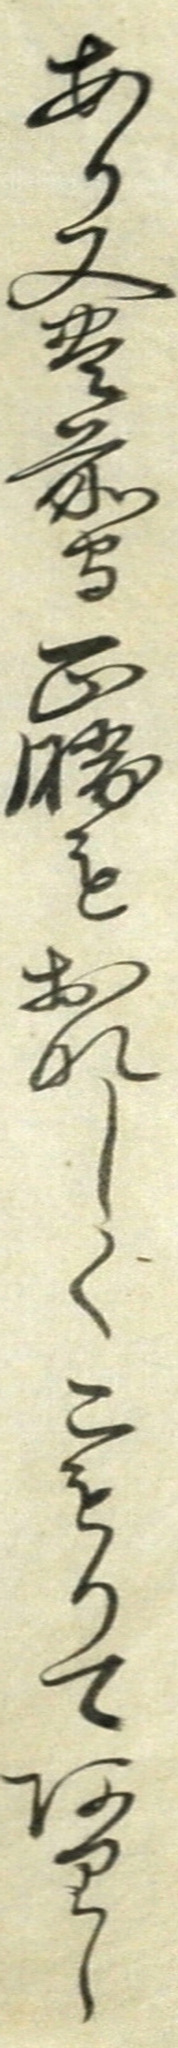あり又豊前守正勝もおなしくこもりてありし
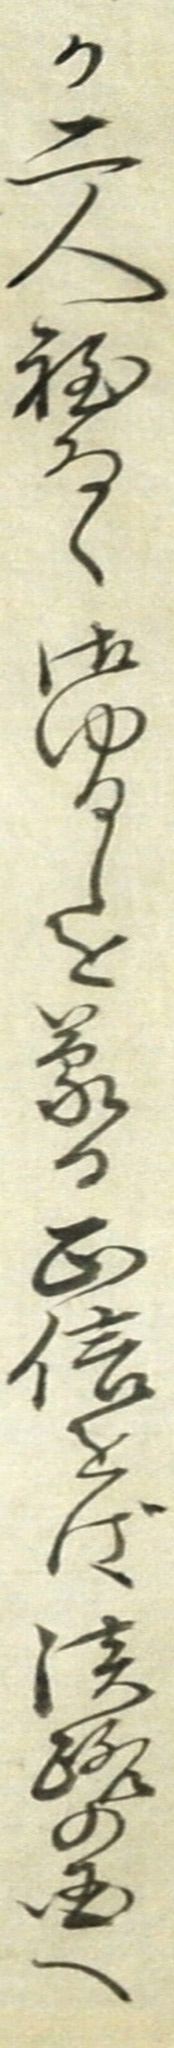か二人程なく御ゆるしを蒙る正信をば淡路の国へ
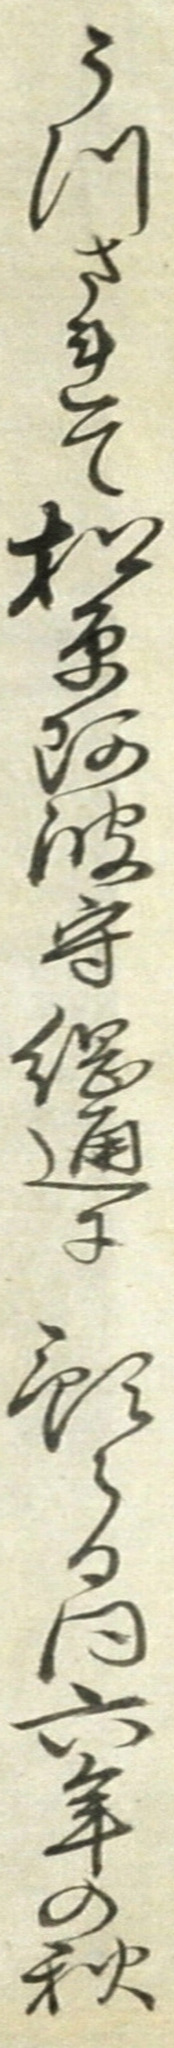うつされて松平阿波守綱通に預らる同六年の秋
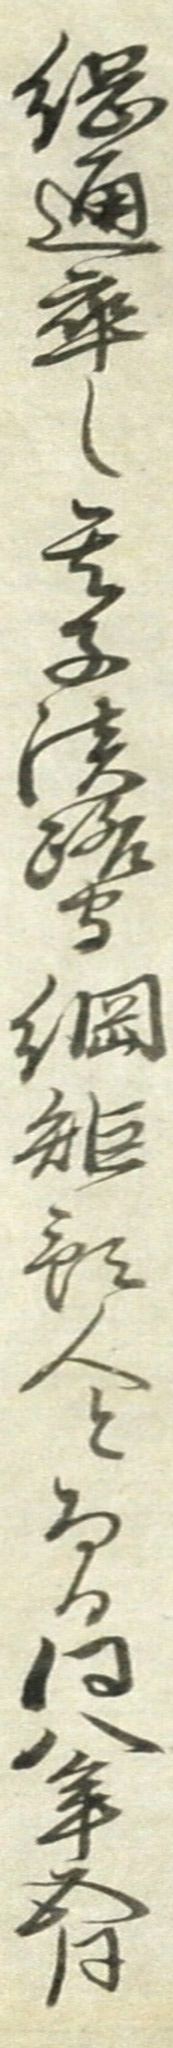綱通卒し其子淡路守綱矩預人となる同八年五月
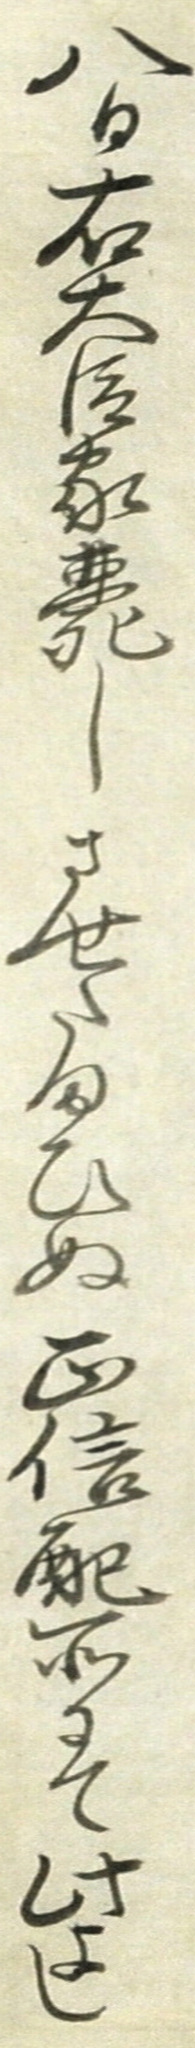八日右大臣家薨しさせたまひぬ正信配所にて此よし
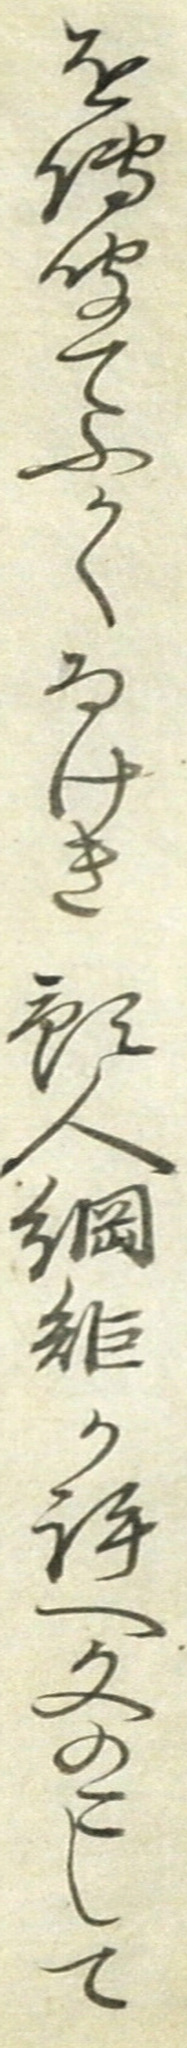を伝聞てふかくなけき預人綱矩か許へ文のこして
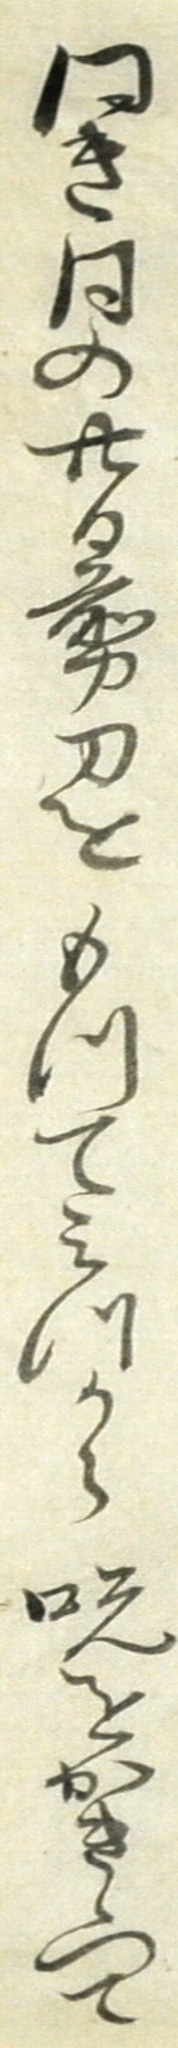同き月の廿日剪刀をもつてみつから吭をかきゝつて
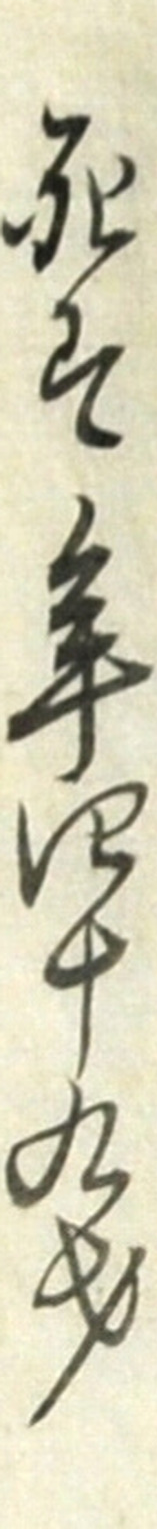死す年四十九才
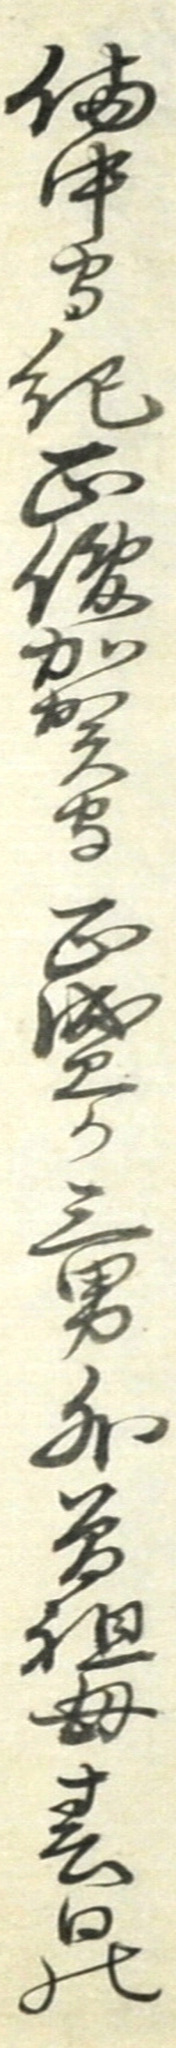備中守紀正俊加賀守正盛か三男外曾祖母春日の
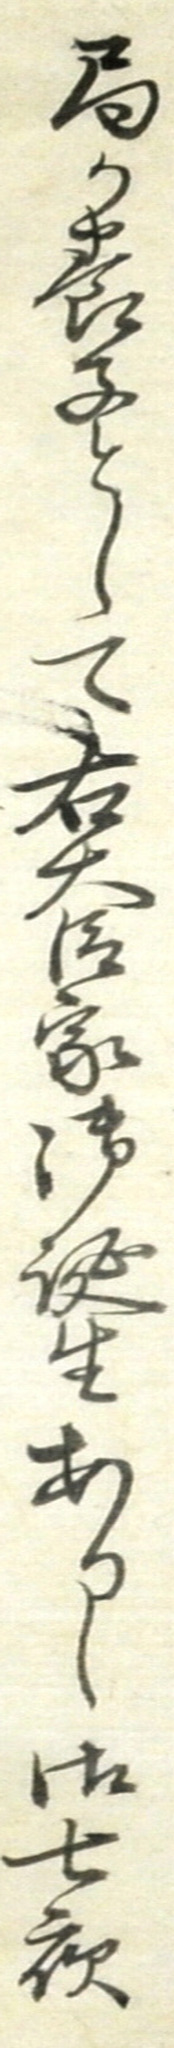局か養子として右大臣家御誕生ありし御七夜
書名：藩翰譜（六）
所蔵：伊那市立高遠町図書館・合同会社AMANE
